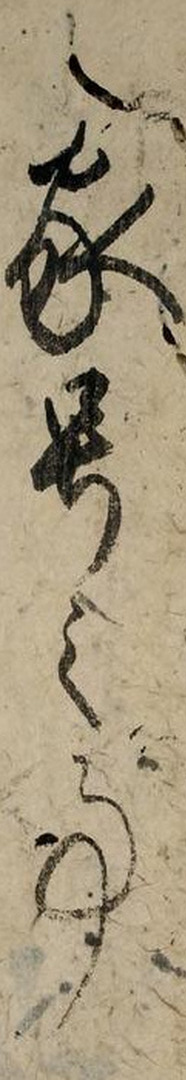家号之事
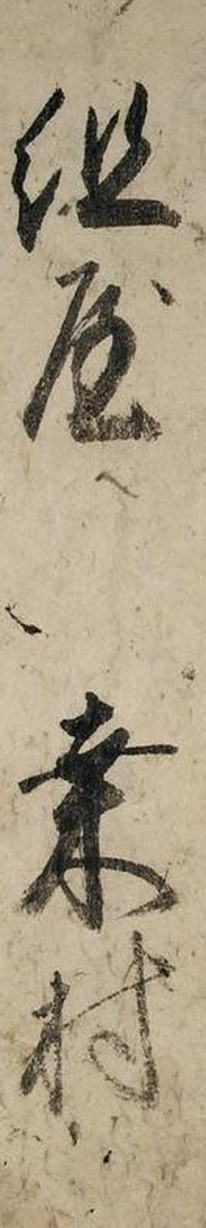組屋桑村
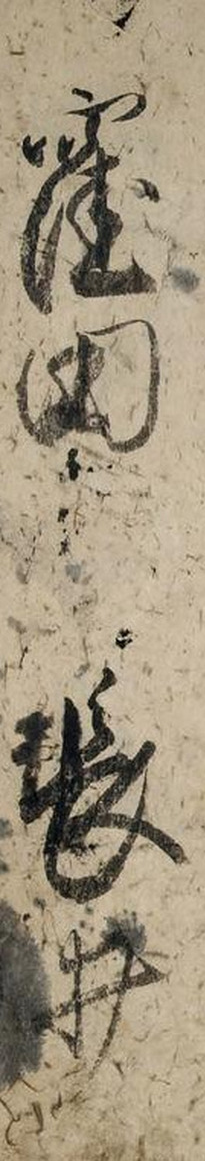窪田長井

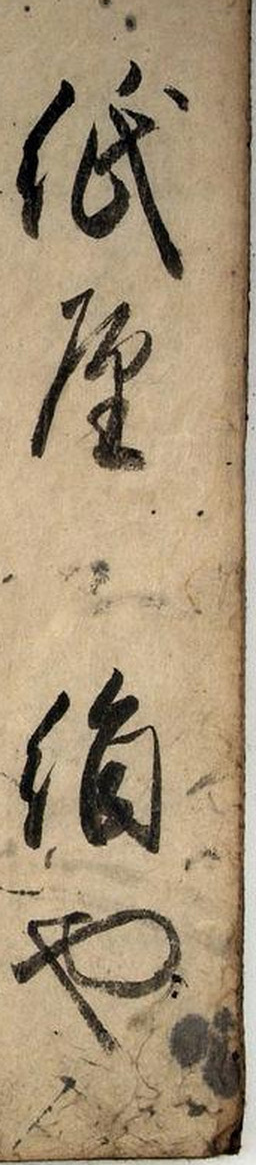紙屋絹や
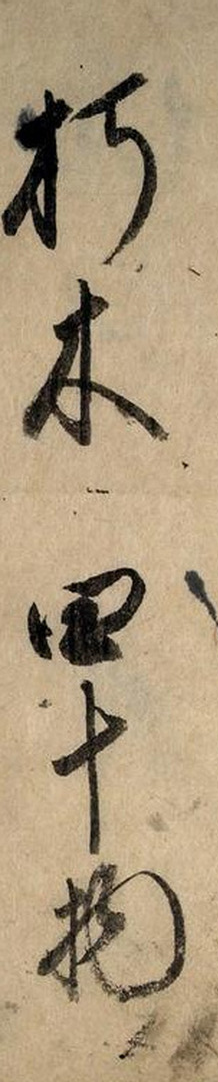朽木四十物
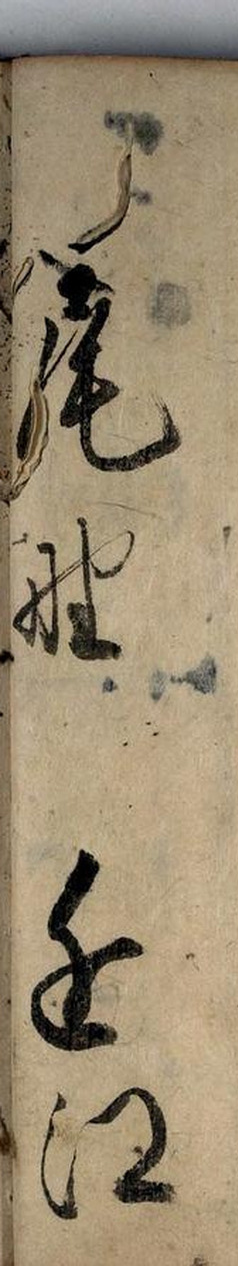尾野近江
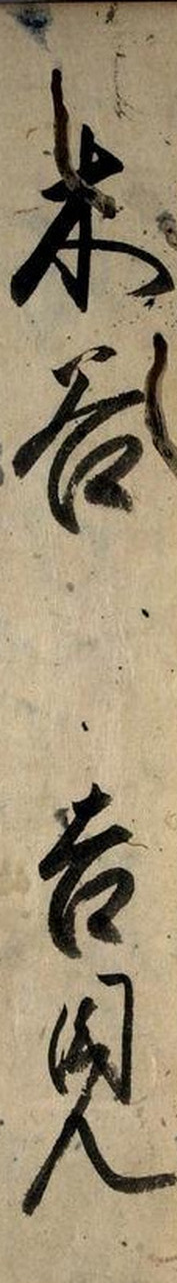木谷吉見
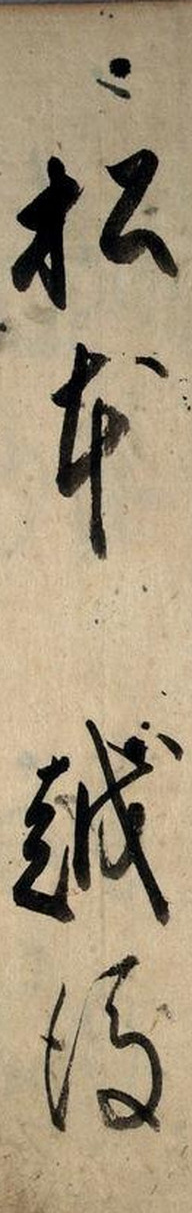松本越後
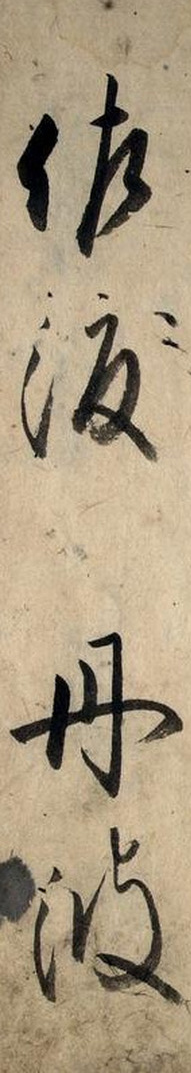佐渡丹波

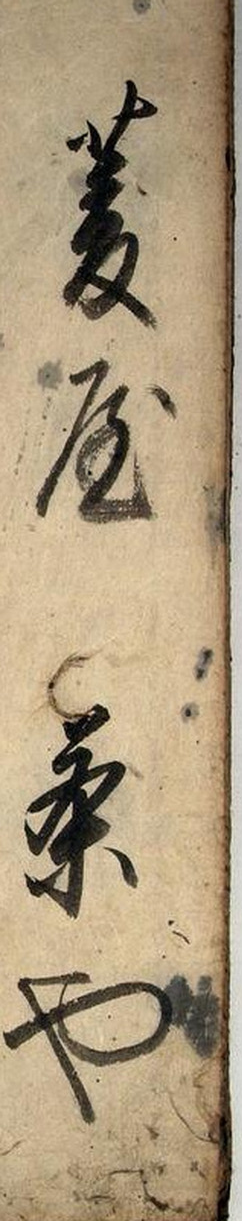菱屋茶や
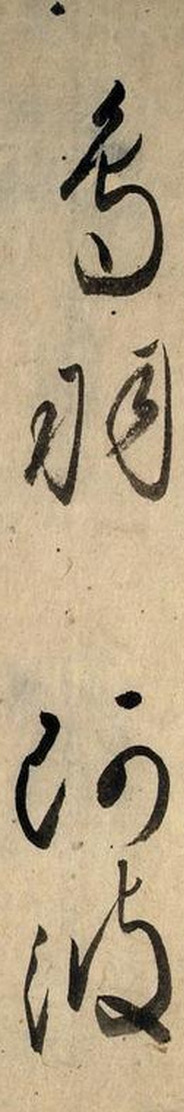鳥羽阿波
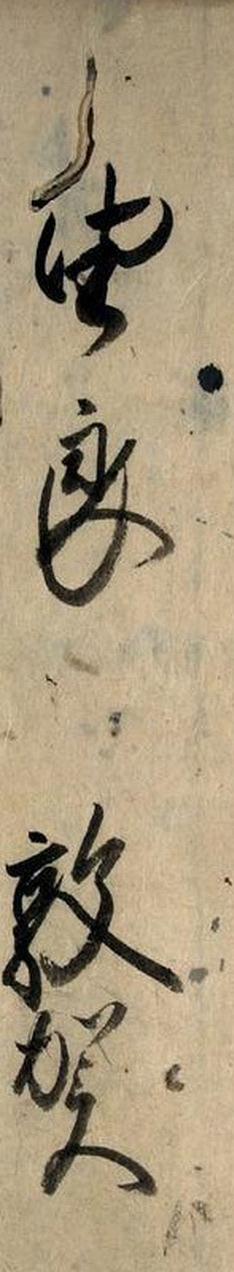由良敦賀
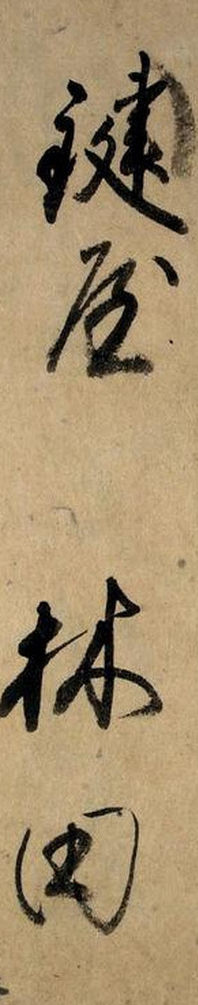鍵屋林田
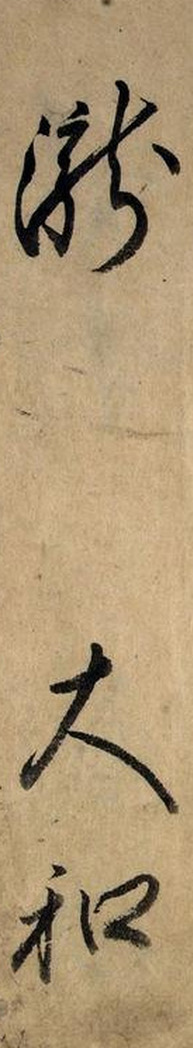瀧大和

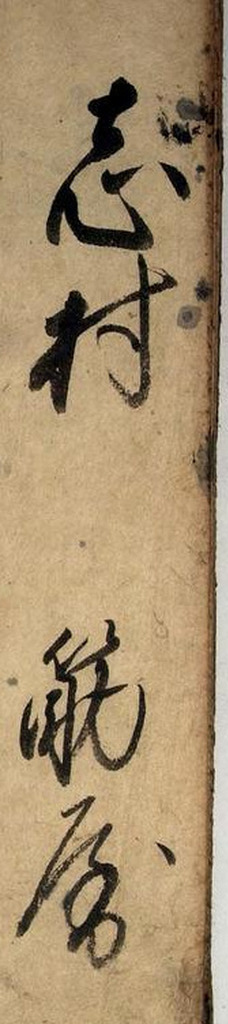志村筋屋
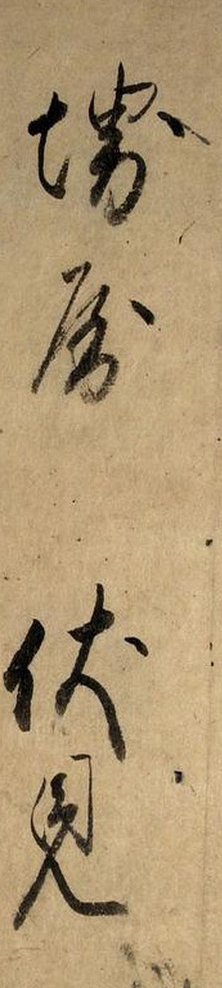堺屋伏見
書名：御手本（手習、家号之事、小浜商家の屋号）
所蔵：福井県文書館 Fukui Prefectural Archives
